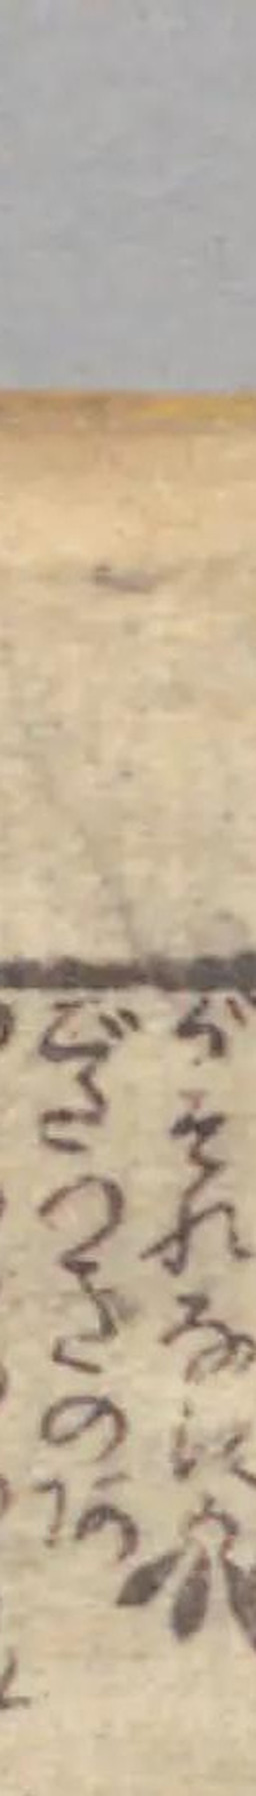ごたつきのあ
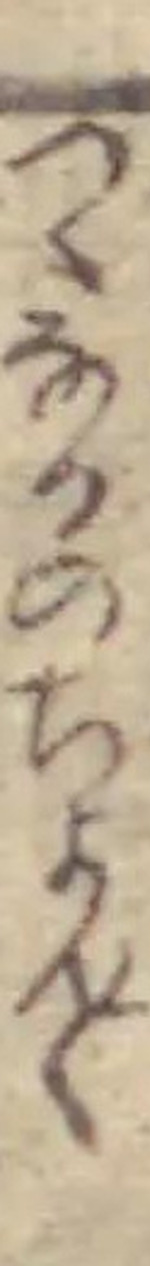つくなるのちよん〳〵
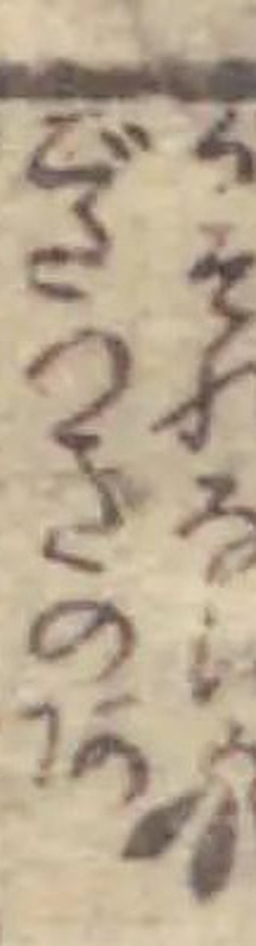ごたつきのあ
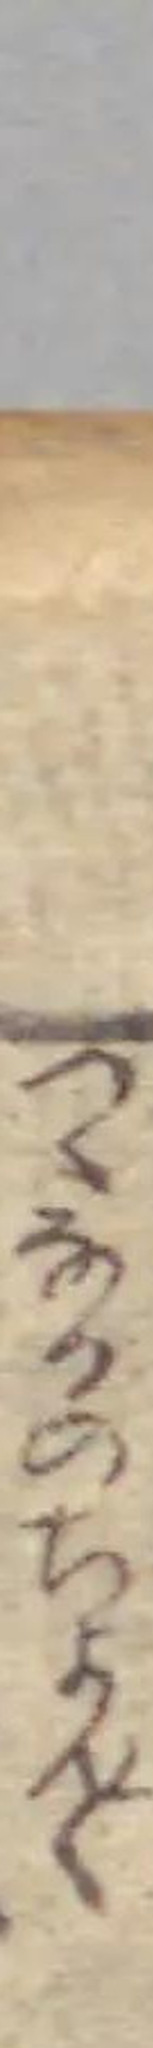つくなるのちよん〳〵
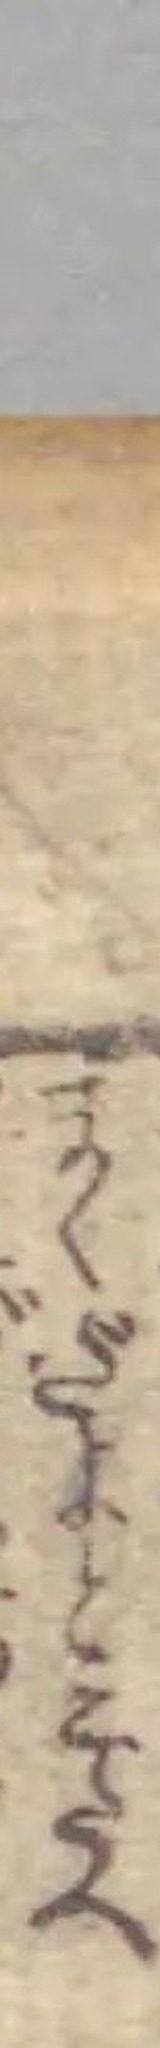まくだよとこたへ
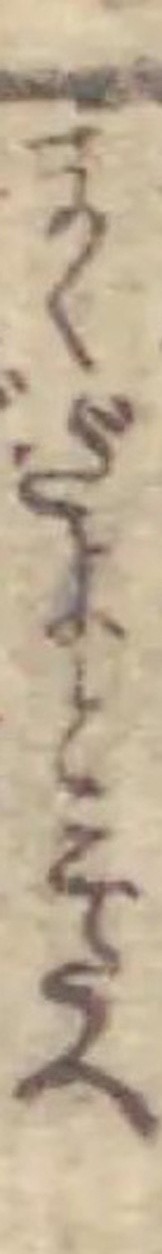まくだよとこたへ
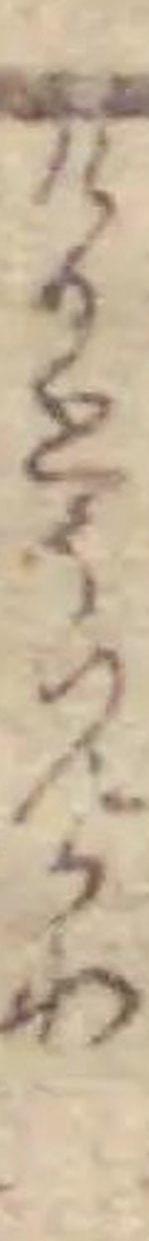けりとういんかわ
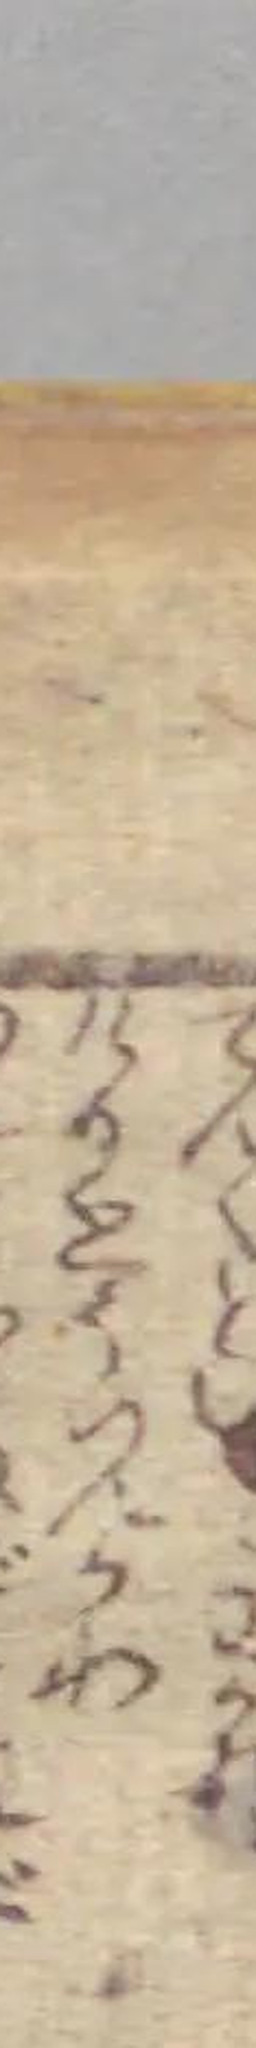けりとういんかわ
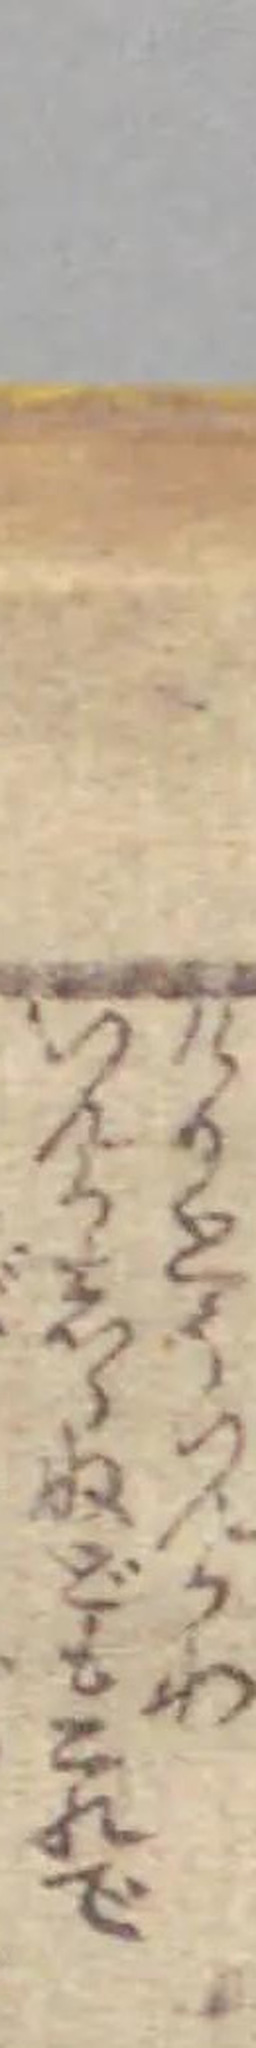いんかしらねどもこれで
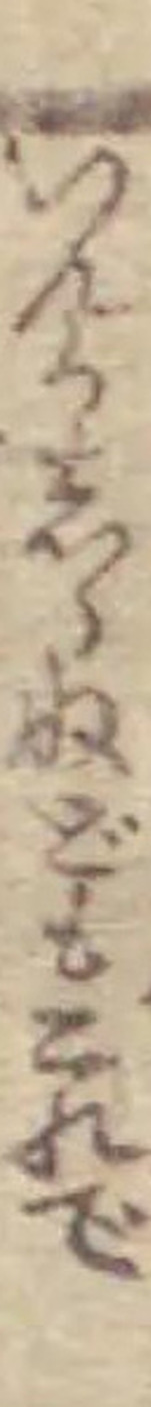いんかしらねどもこれで
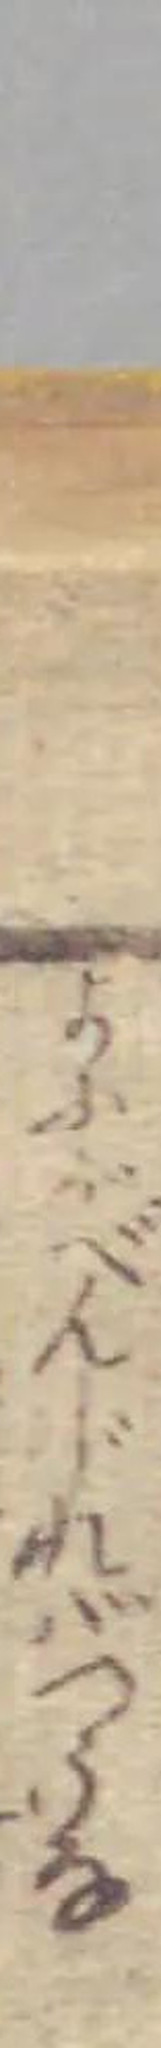よふがべんじればつうな
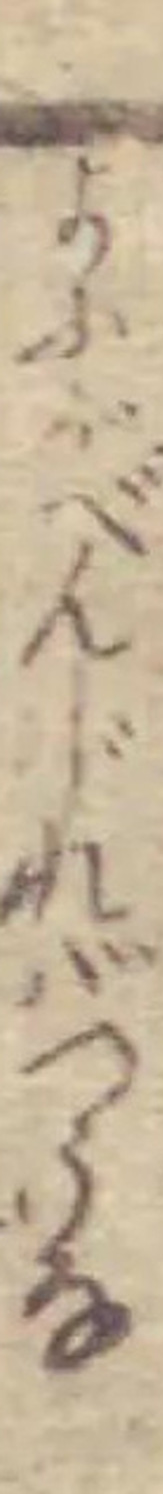よふがべんじればつうな
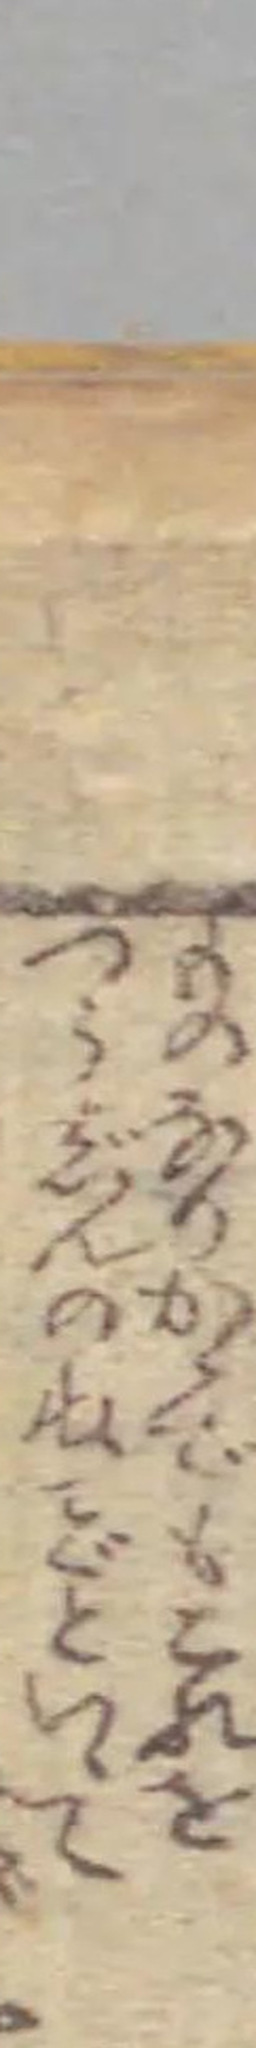つうじんのねごとといゝて
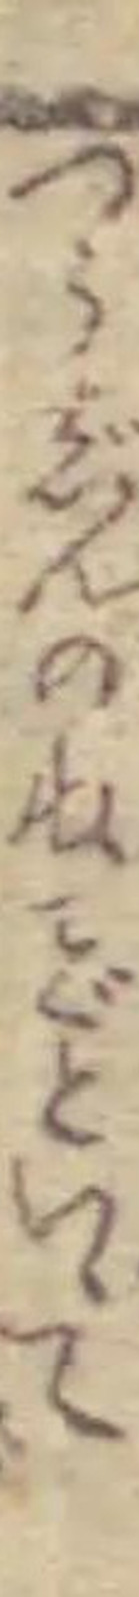つうじんのねごとといゝて
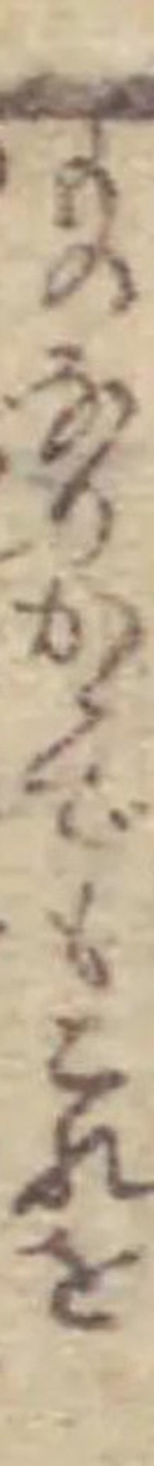ものなりからでもこれを

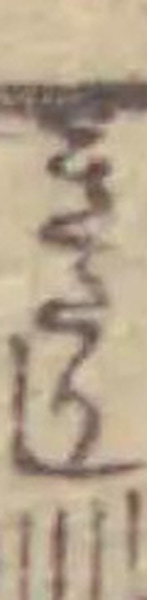きたりし
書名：茶羅毛通人 3巻
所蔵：国立国会図書館 National Diet Library, JAPAN
